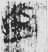○（夏）
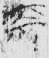○（夕）
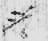之
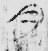月
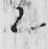乙
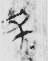丑
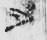之
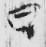日
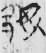路鄢
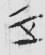正
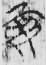婁
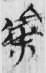虜
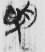受
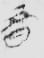○（期）
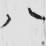八
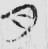月
